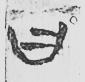曰
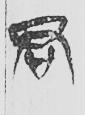君
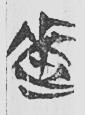麥
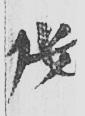伐
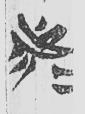我=
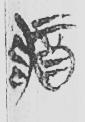𨟻
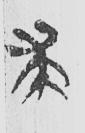求
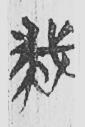{求戈}
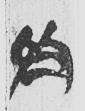於
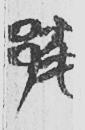○（蔡）
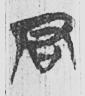君
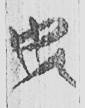𡚦
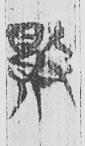敗
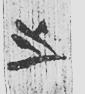之
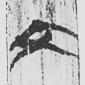文
